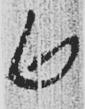㠯（以）
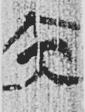内（納）
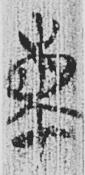諫
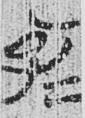孔子
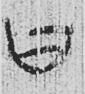曰
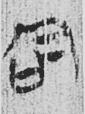含（今）
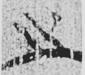之
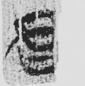君
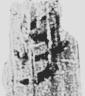子
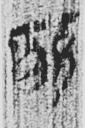所
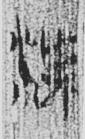滐（竭）
